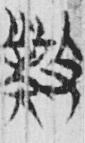○（質）
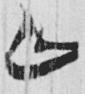㠯（以）
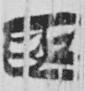爲
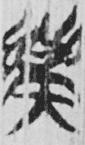樂
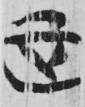正
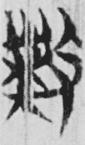○（質）
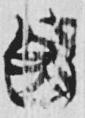既
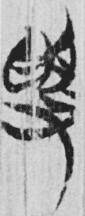受
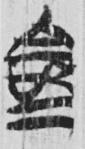命
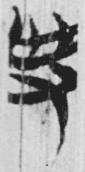拃（作）
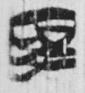爲
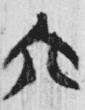六
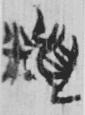頪（律）
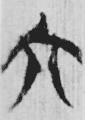六
